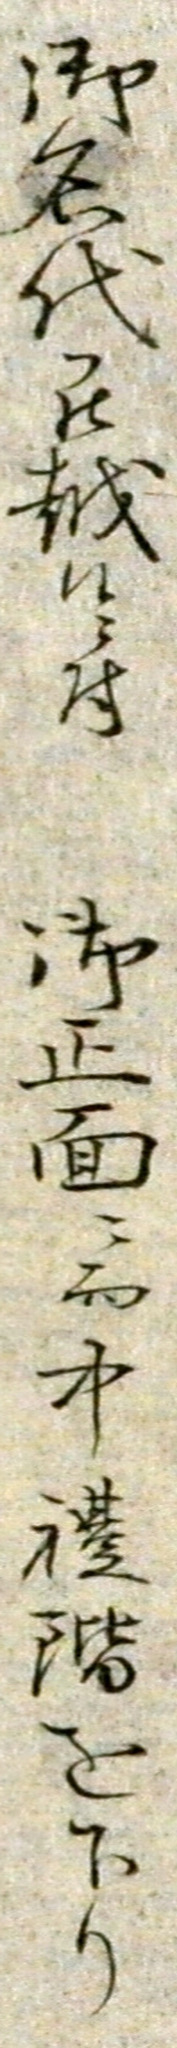御名代罷越候ニ付御正面ニ而中禮階を下り
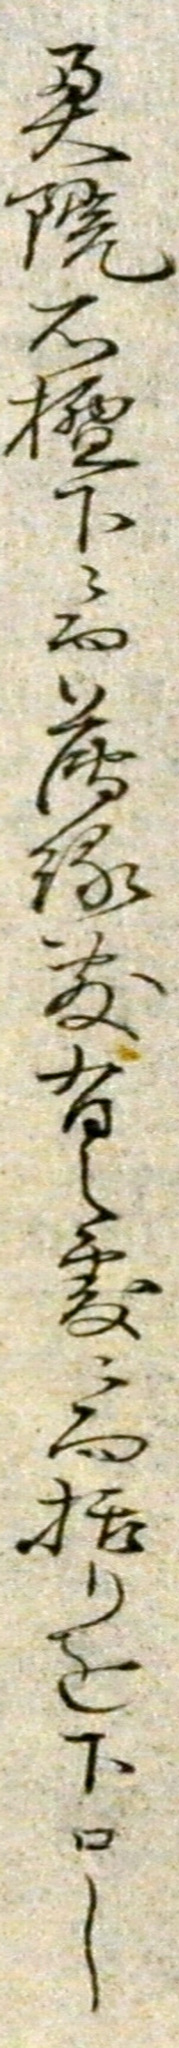奥院右檀下ニ而薄縁敷有之處ニ而括りを下ロし
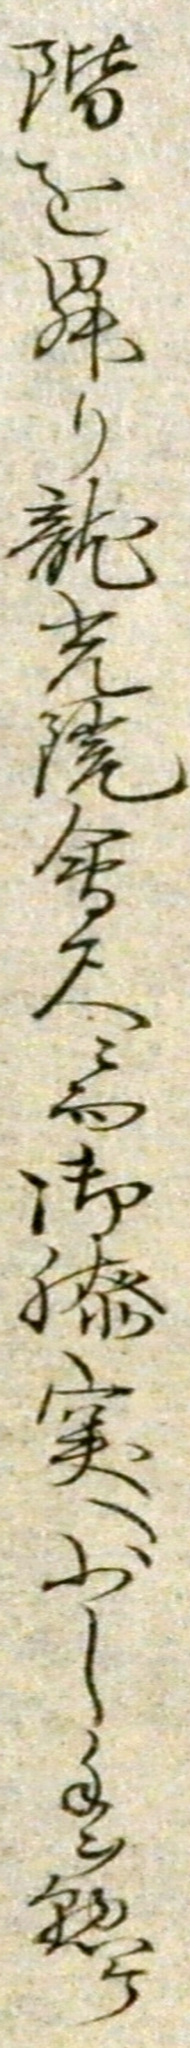階を昇り龍光院会尺ニ而御膝突へ少し手ヲ懸ヶ
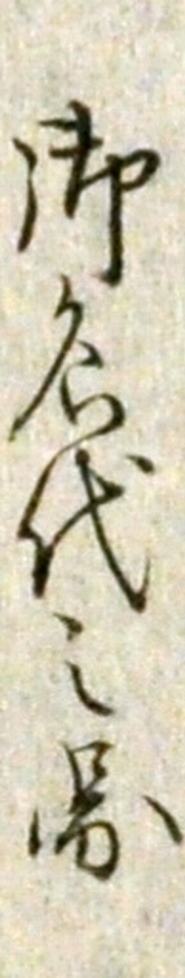御名代之図

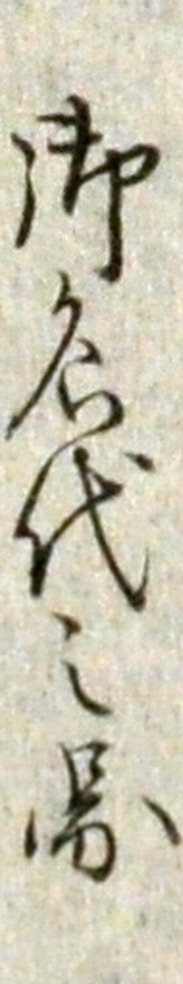御名代之図
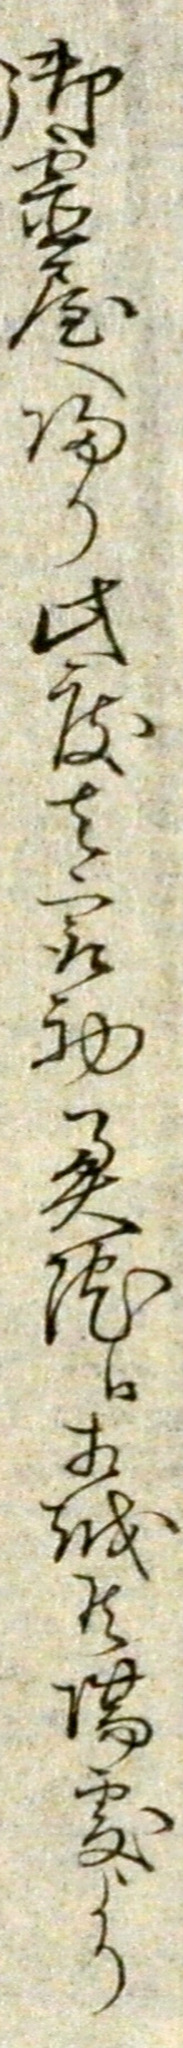御霊屋へ帰り此度者最初奥院江相越候場處より
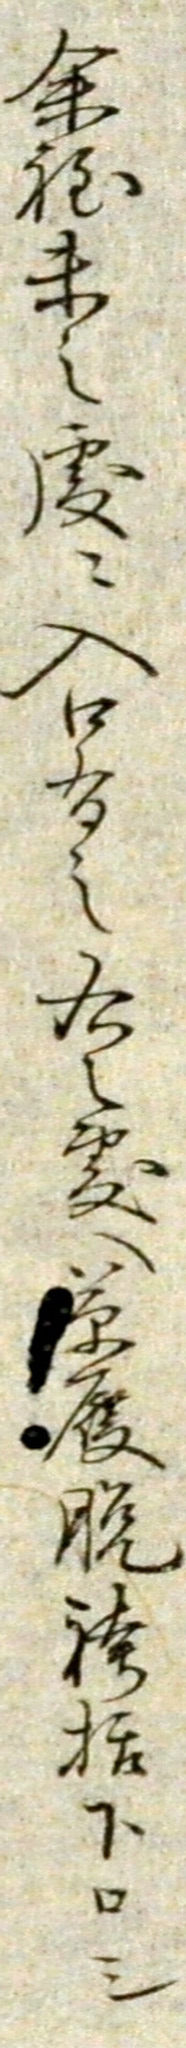余程来し處ニ入口有之右之處へ草履脱袴括り下ロシ
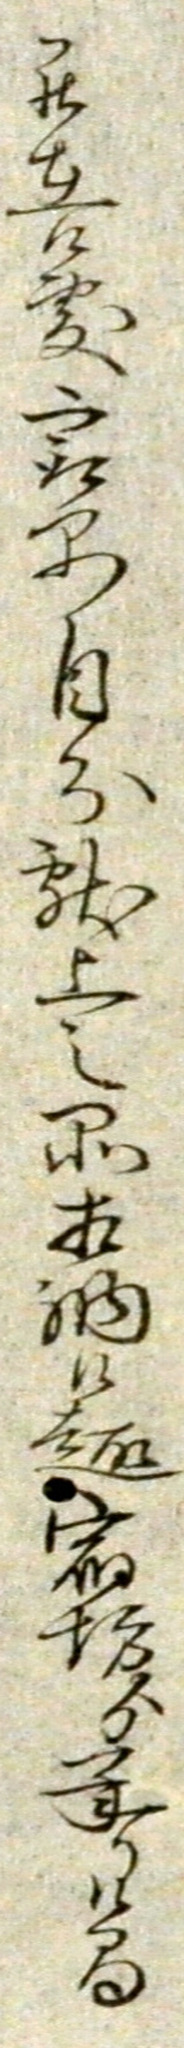罷在候處最早自分献上之品相納候趣宿坊ゟ承り候間
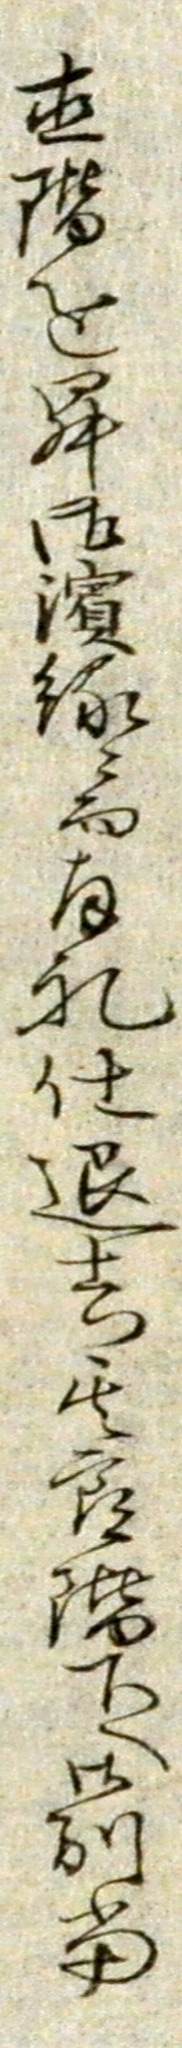直階を昇御濱縁ニ而拝礼仕退去其節階下へ御別当
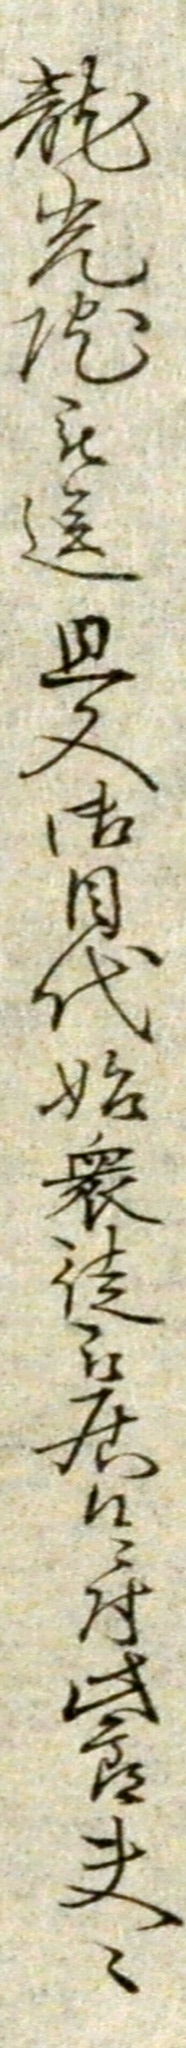龍光院被送且又御目代始衆徒被居候ニ付此節夫々
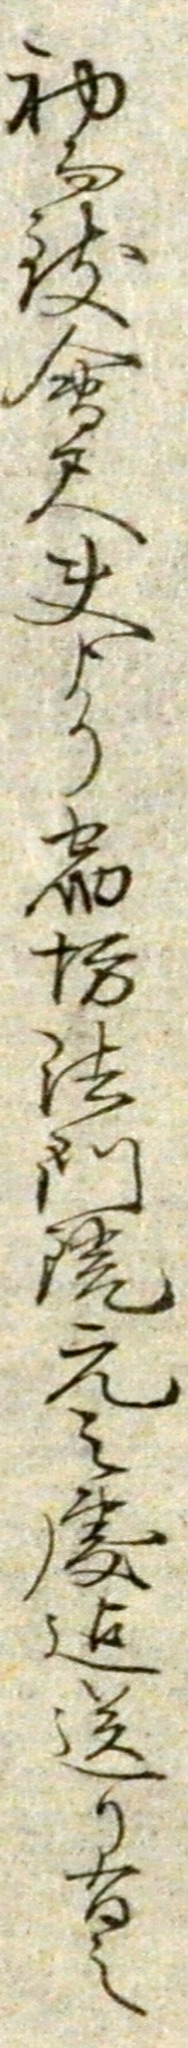初而致会尺夫より宿坊法門院元之處迠送り有之
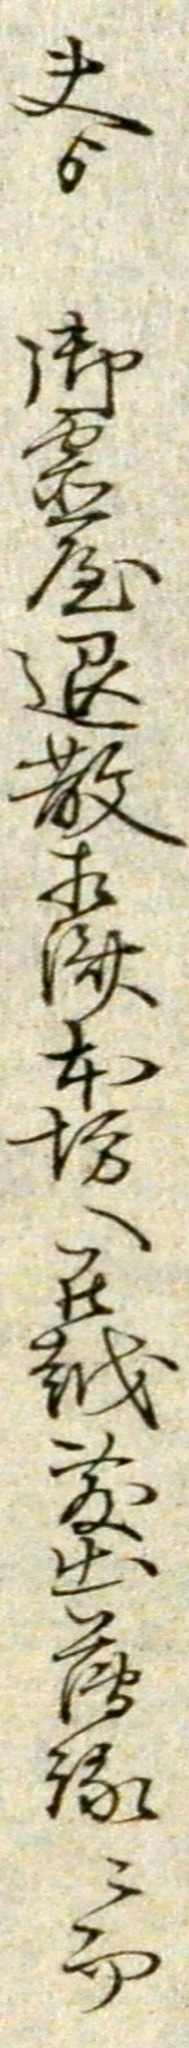夫ゟ御霊屋退散相済本坊へ罷越敷出薄縁ニ而
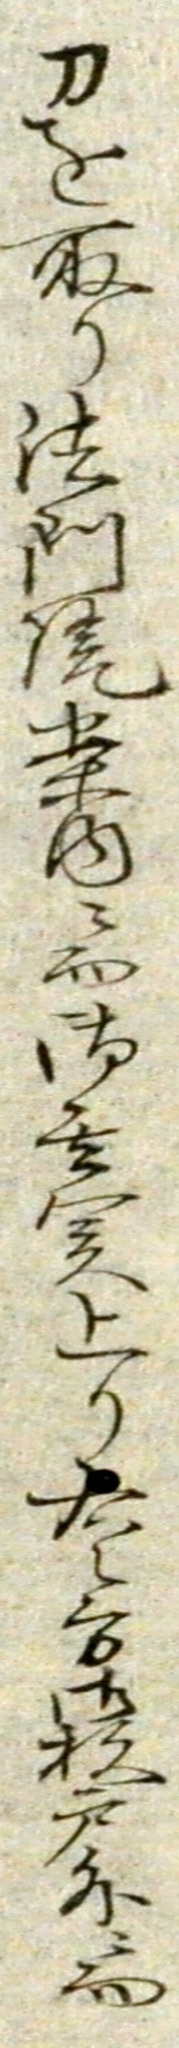刀を取り法門院案内ニ而御玄関上り右之方御杉戸外ニ而
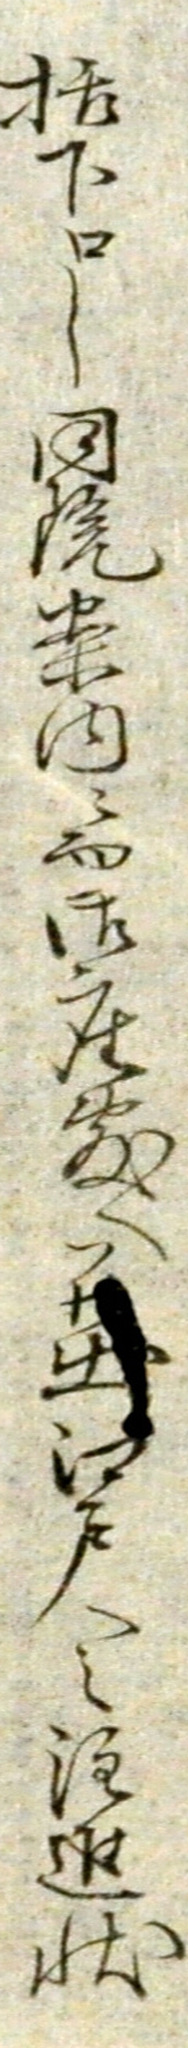括下ロし同院案内ニ而御座敷へ罷出江戸へ之注進状
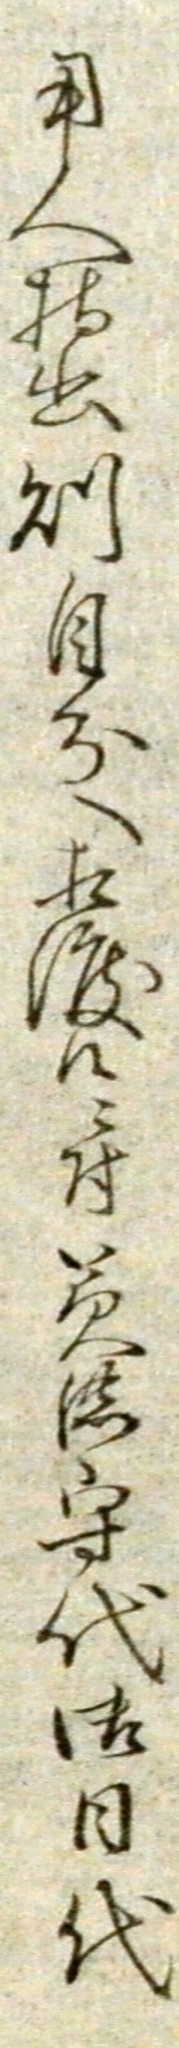用人持出則自分へ相渡候ニ付美濃守代御目代
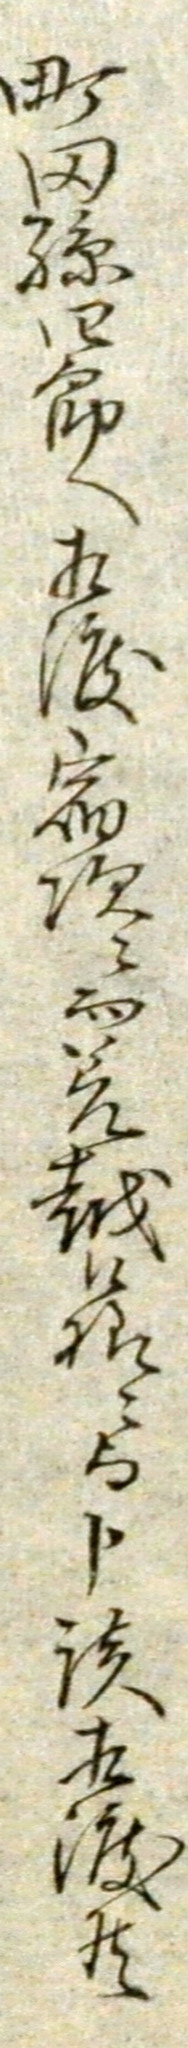町田孫四郎へ相渡宿次ニ而差越候様ニと申談相渡候
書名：日光御名代相勤候節ノ留
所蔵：伊那市立高遠町図書館・合同会社AMANE
